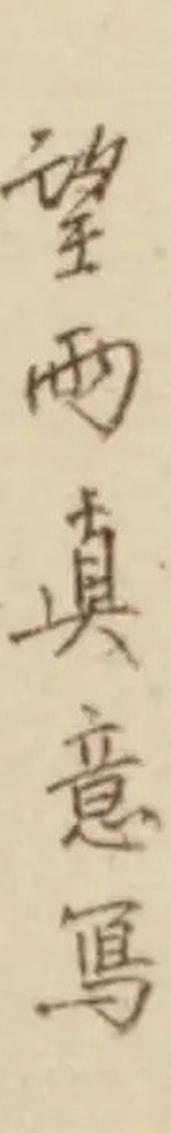望両真意寫
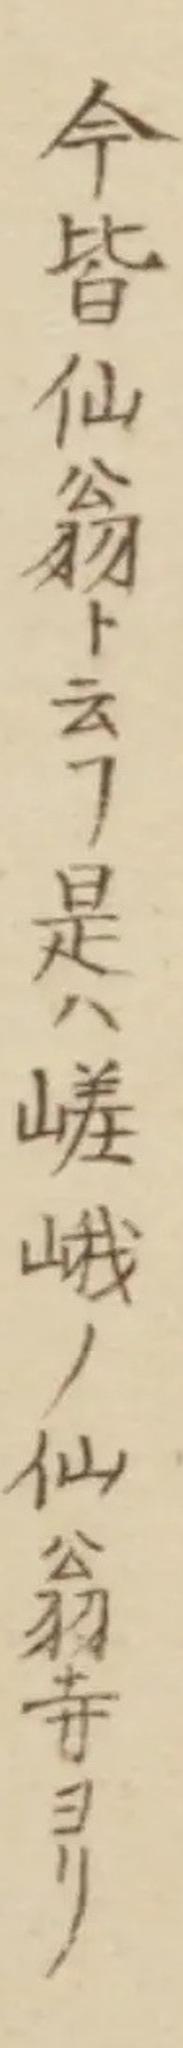今皆仙翁と云ふ是ハ嵯峨の仙翁寺より
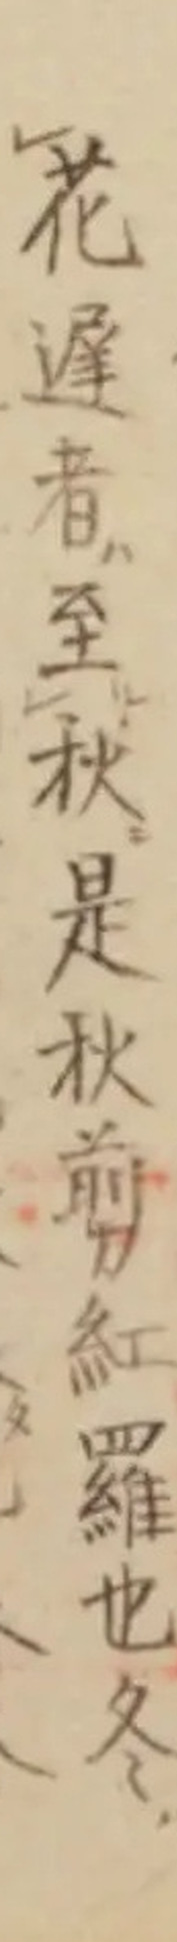花遅者は至る秋に是秋剪紅羅也冬は

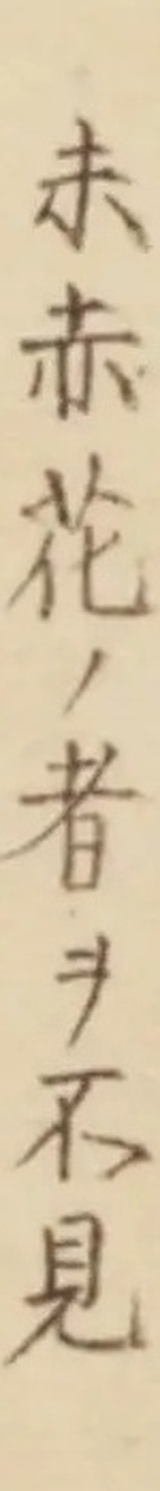未赤花の者を不見
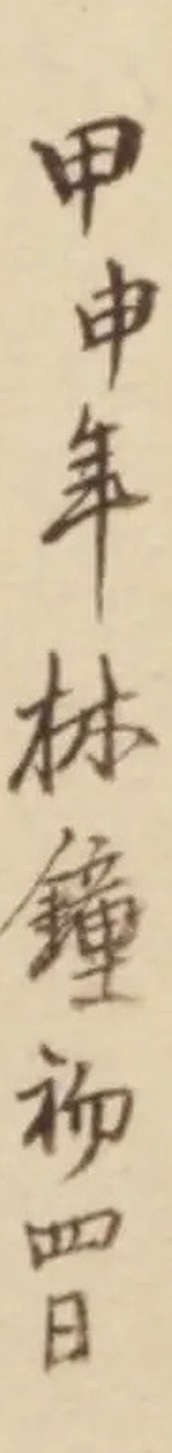甲申年林鐘初四日

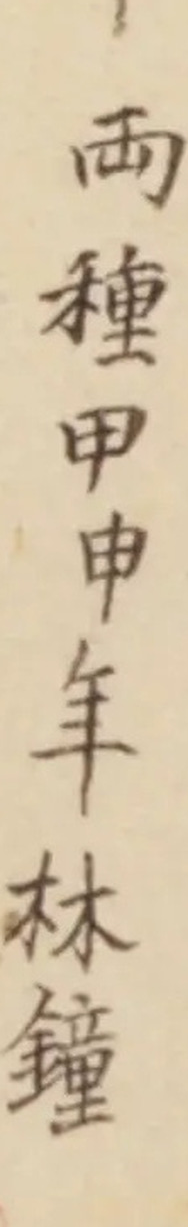両種甲申年林鐘
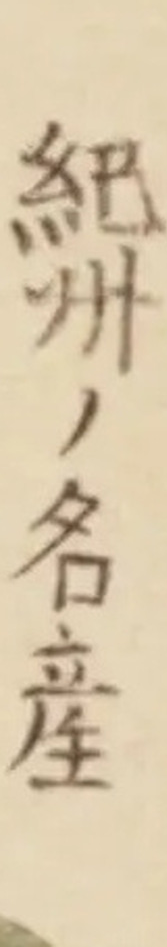紀州の名産
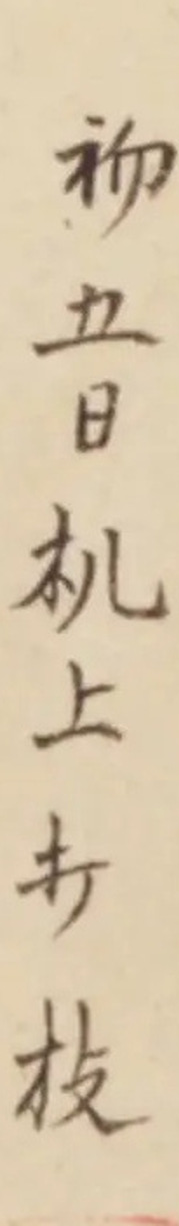初五日机上打枝

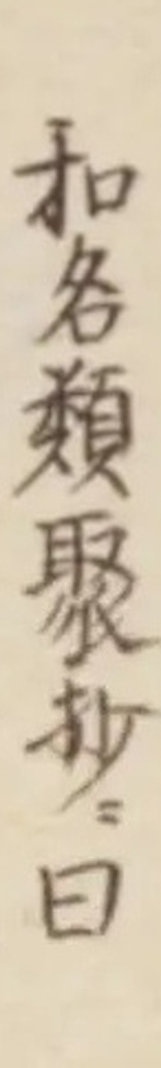和名類聚抄ニ曰
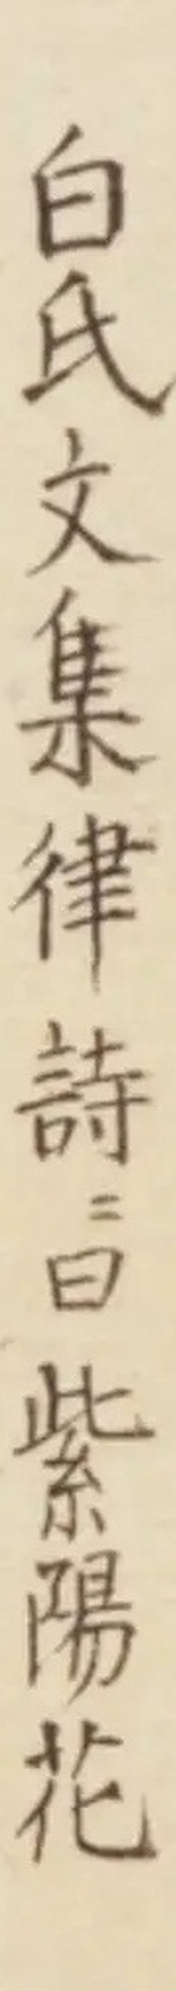白氏文集律詩に曰紫陽花
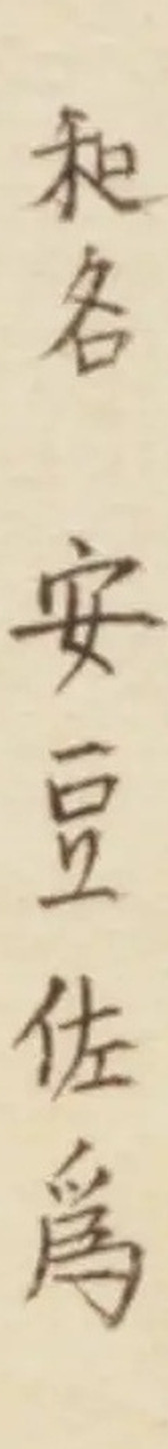和名安豆佐爲
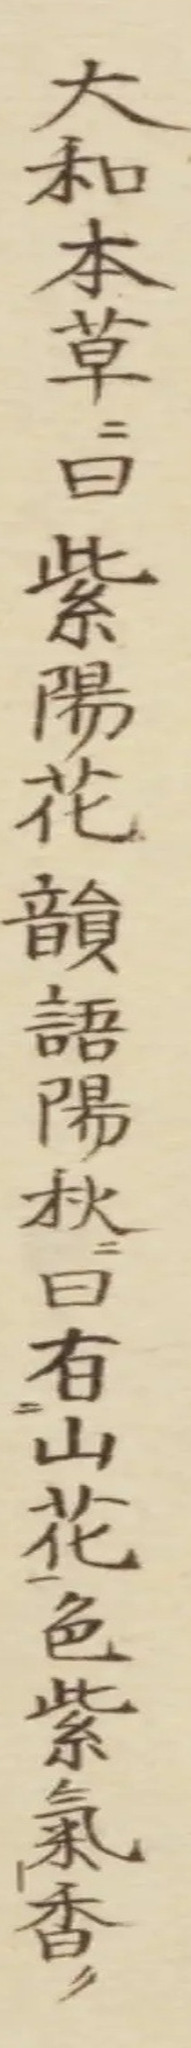大和本草に曰紫陽花韻語陽秋に曰有山花色紫氣香りく
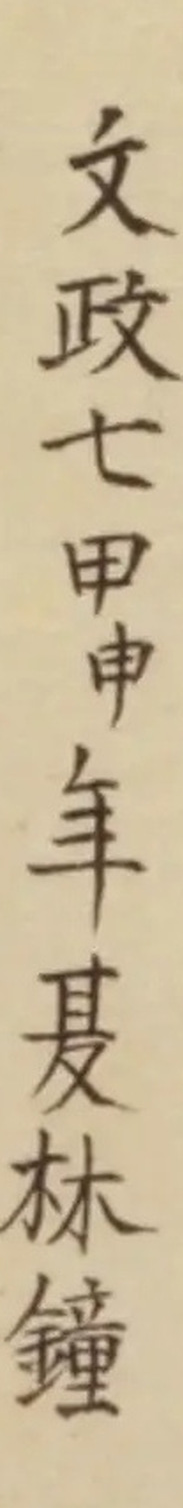文政七甲申年夏林鐘
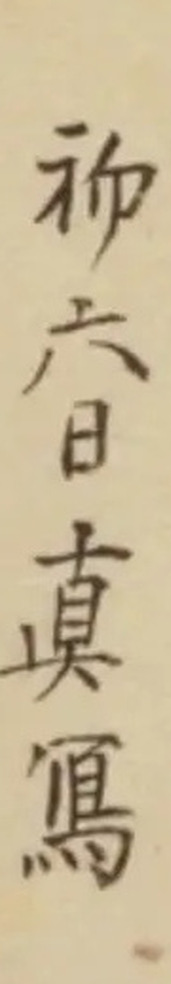初六日真寫

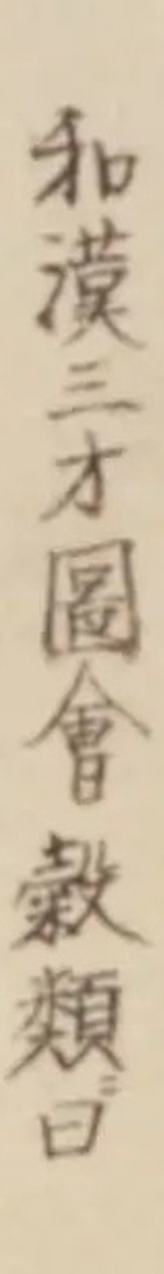和漢三才圖會穀類ニ曰
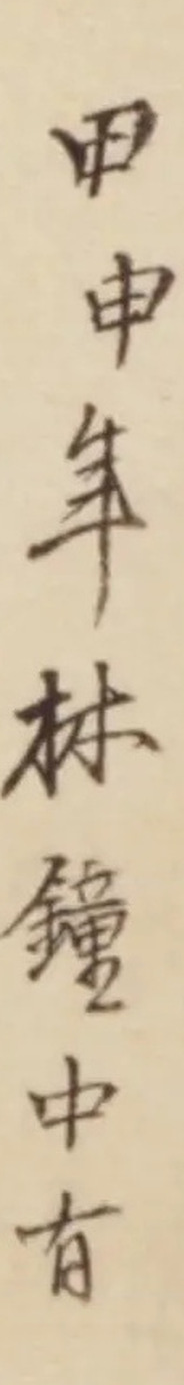甲申年林鐘中有
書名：梅園草木花譜夏之部. 2
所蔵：国立国会図書館 National Diet Library, JAPAN
